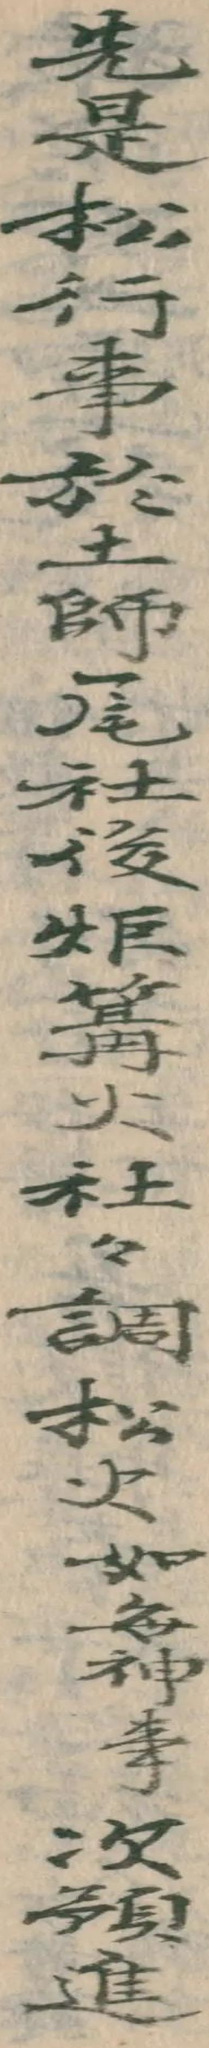先是松行事於土師尾社後炬篝火社々調松火如毎神事次預進
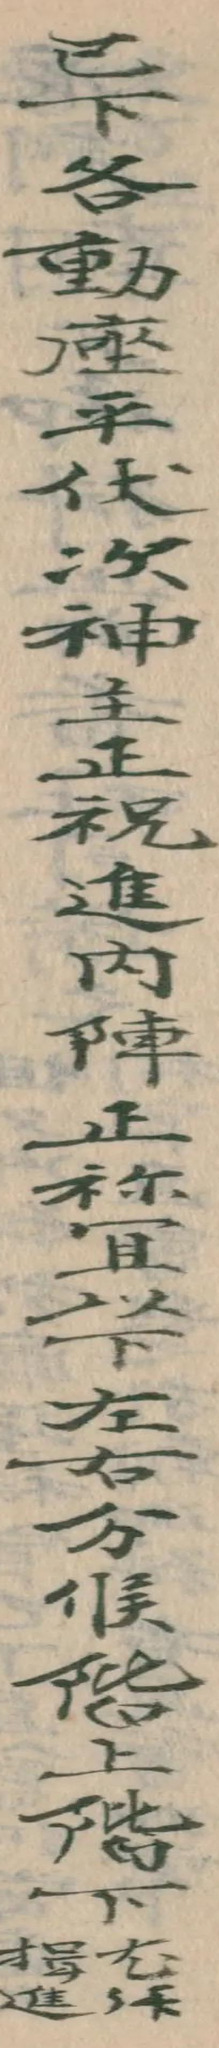已下各動座平伏次神主正祝進内陣正祢宜以下左右分候階上階下尤拝揖進

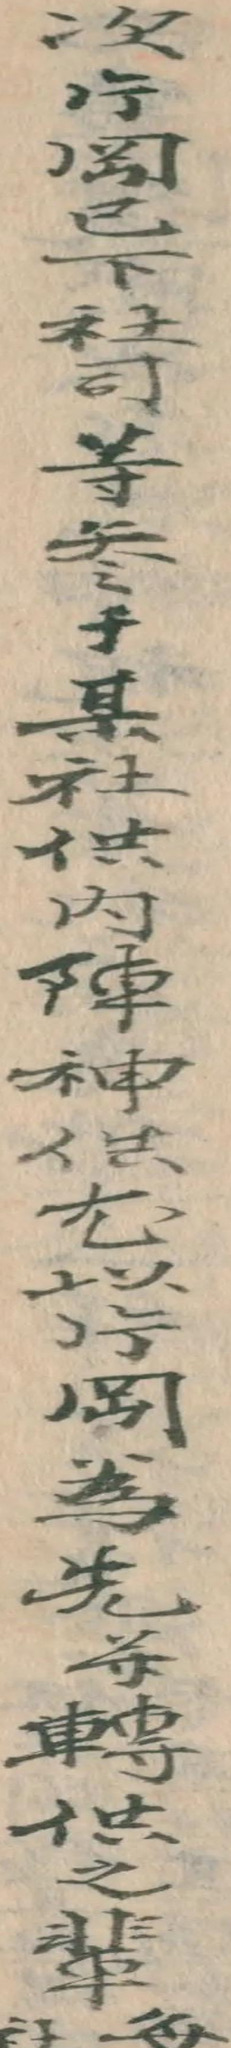次片岡已下社司等参于某社供内陣神供尤以片岡為先并転供之輩毎社
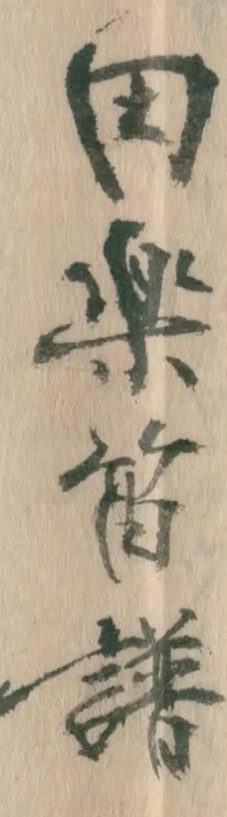田楽笛譜

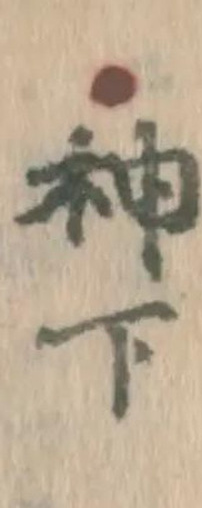●神下

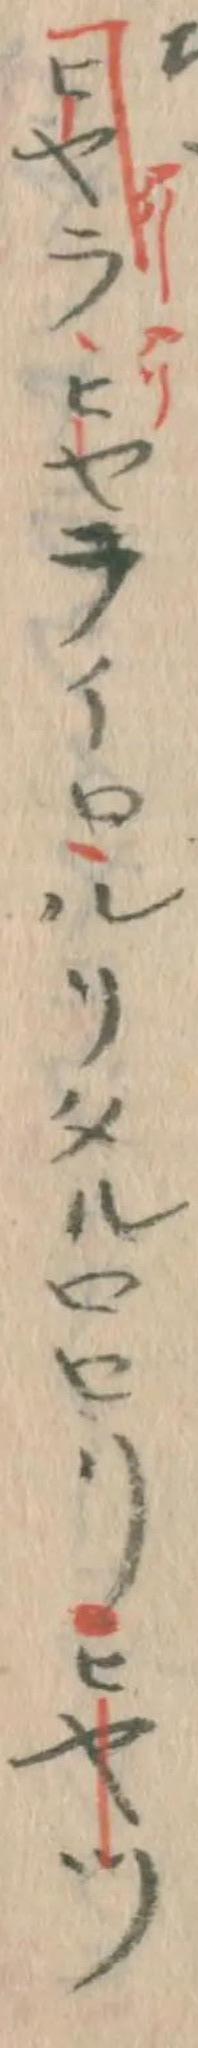ヒ-ヤラヒ-ヤライロ・ルリタルロロリ・ヒ-ヤ-ツ
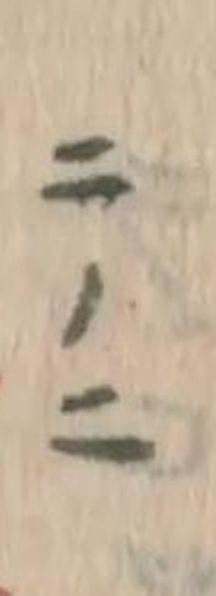二ノ二
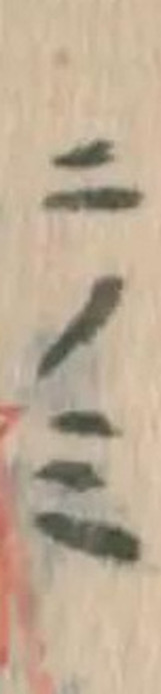二ノ一
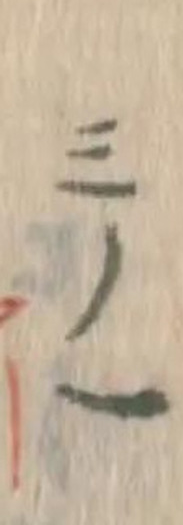二ノ一
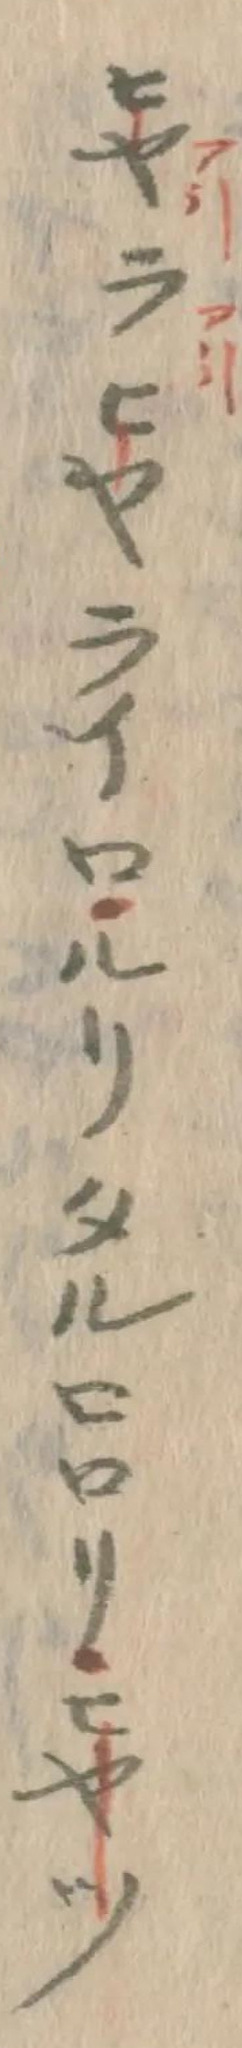ヒ-ヤラヒ-ヤライロ・ルリタルロロリ・ヒ-ヤ-ツ
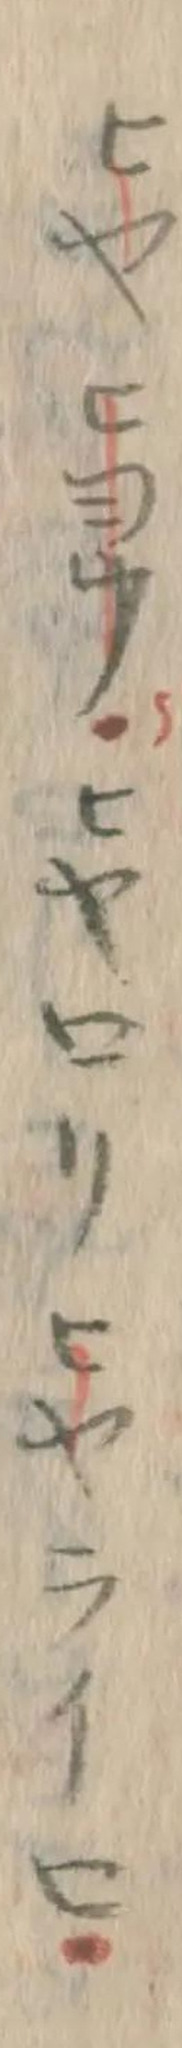ヒ-ヤヒ-ヨ-ウ・ヒヤロリヒ-ヤライロ・
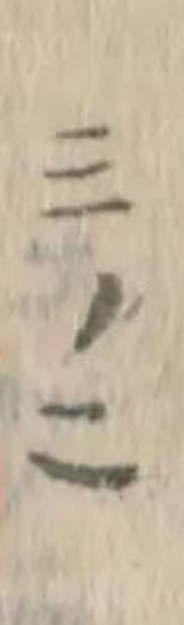三ノ二
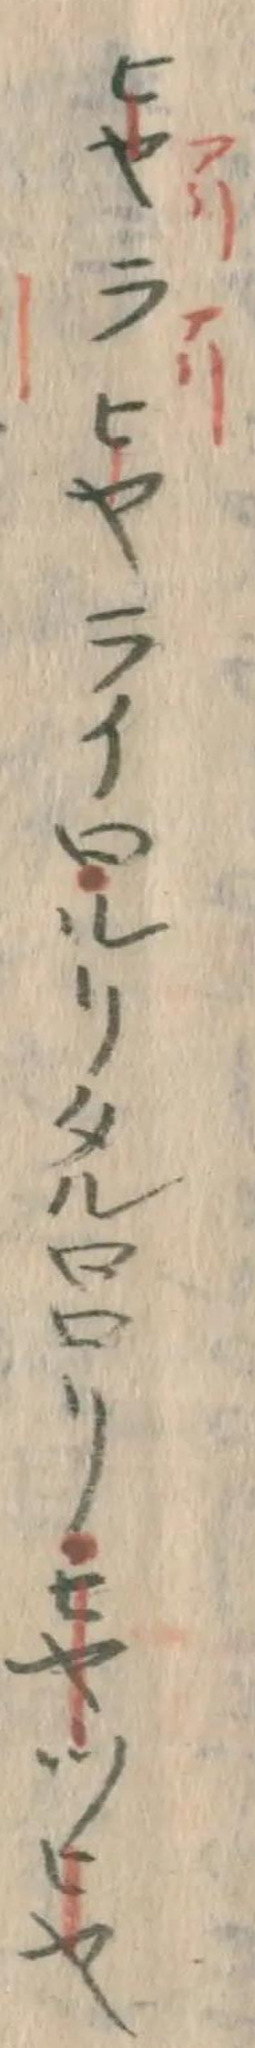ヒ-ヤラヒ-ヤライロ・ルリタルロロリ・ヒ-ヤ-ツヒ-ヤ
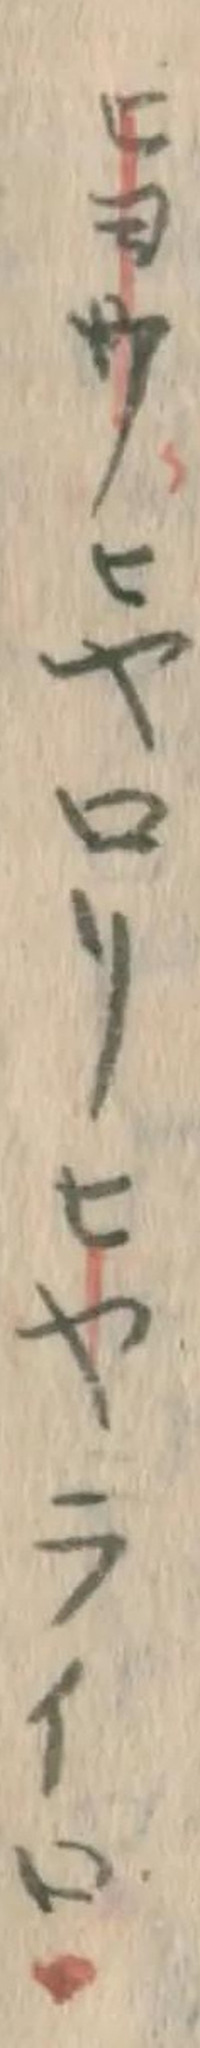ヒ-ヨ-ウヒヤロリヒ-ヤライロ・
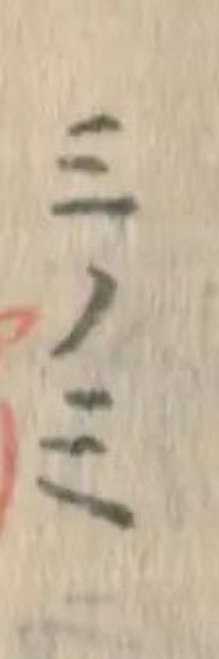三ノ三
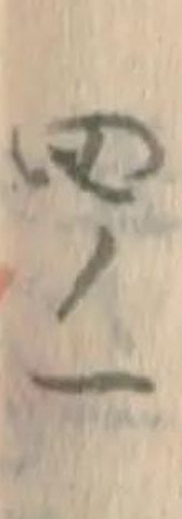四ノ一
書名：賀茂社記録. 第9冊
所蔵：国立国会図書館 National Diet Library, JAPAN
